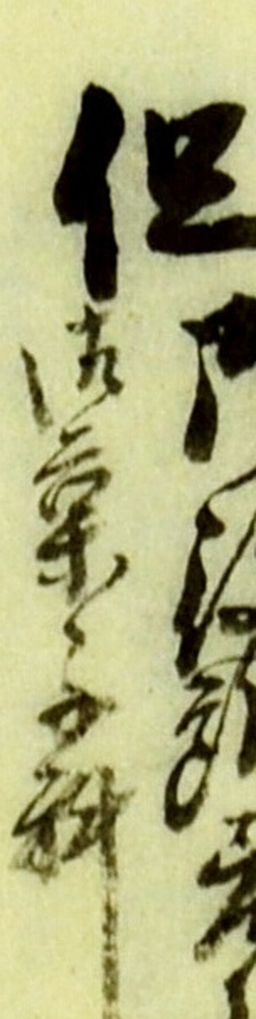御菓子料
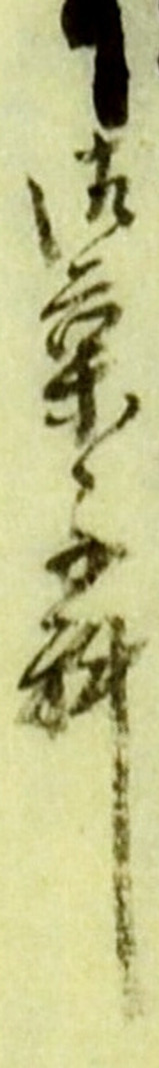御菓子料
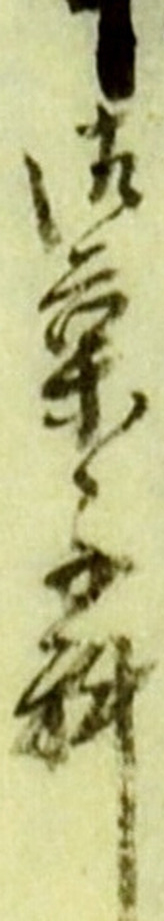御菓子料
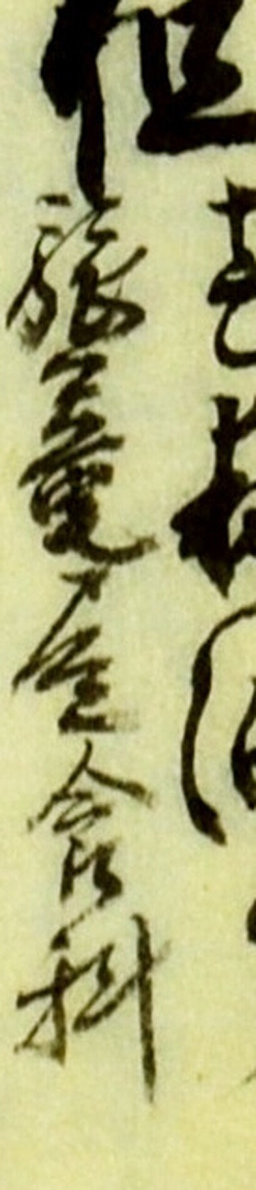旅籠屋食料
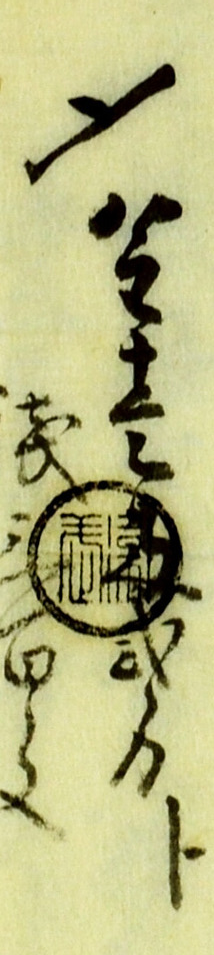〆金壱両弐分ト
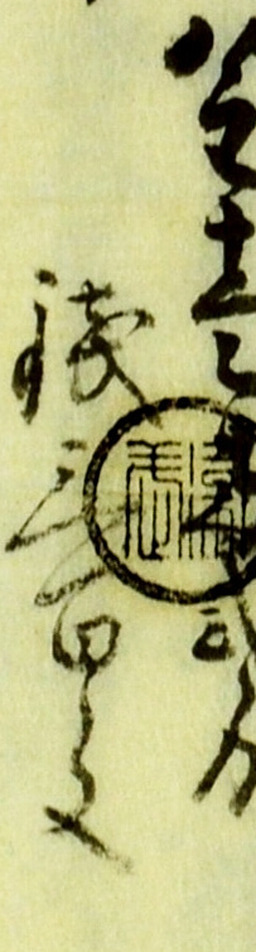銭三百文
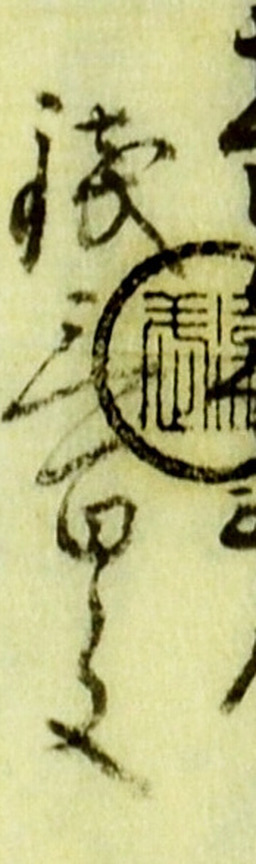銭三百文
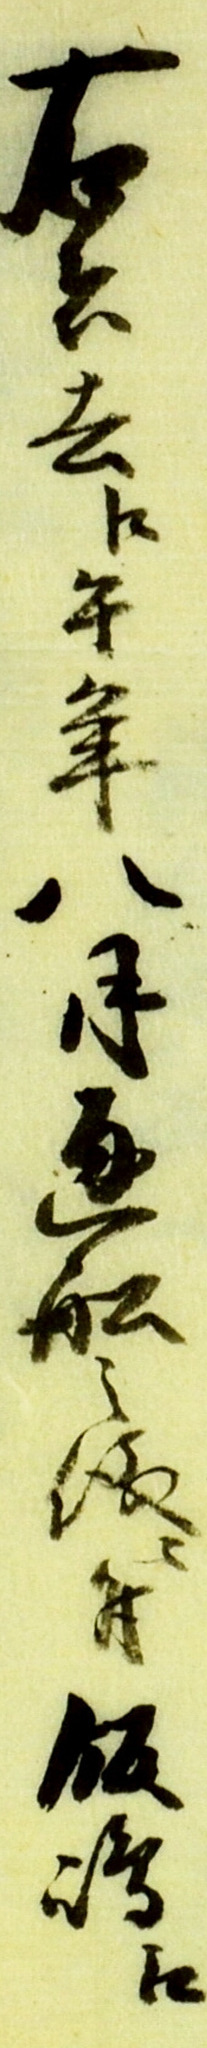右者去ル午年八月通船之儀ニ付飯嶋江
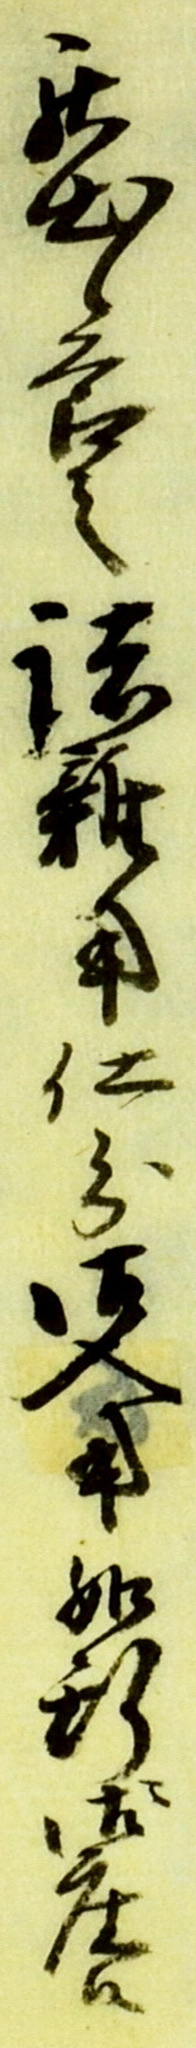罷出候節之諸雑用仕分御入用如斯ニ御座候
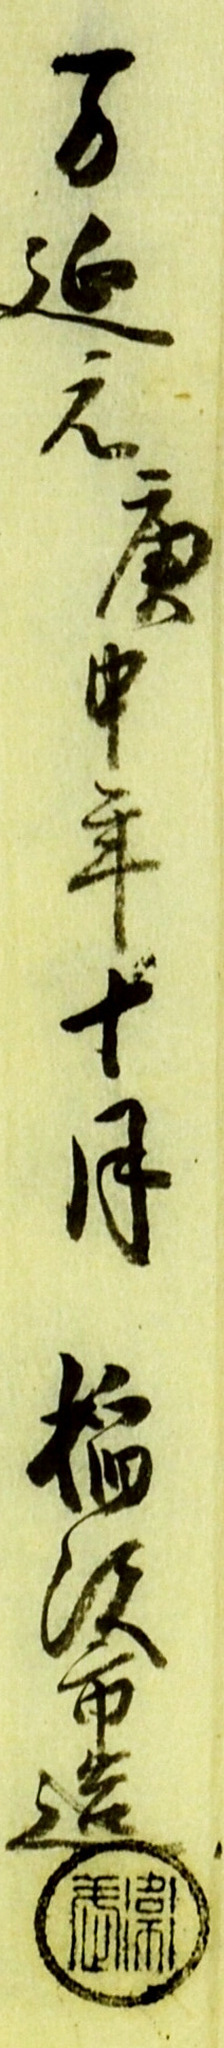万延元庚申年十月稲沢市造㊞
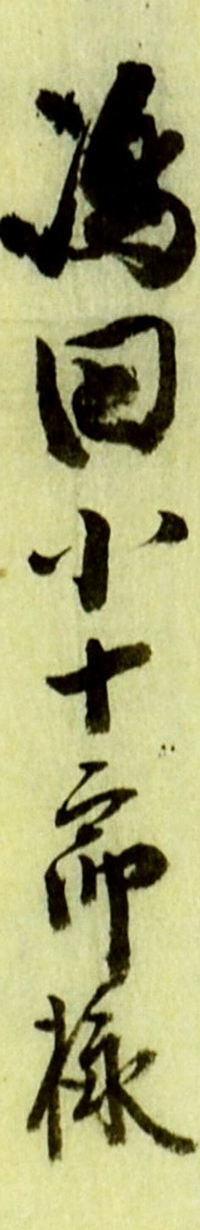嶋田小十郎様
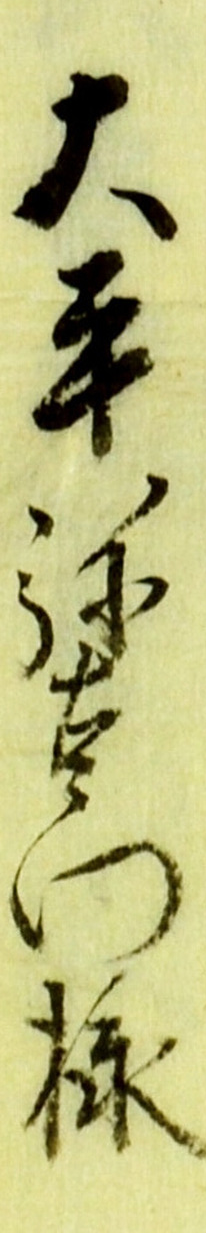大平弥右衛門様

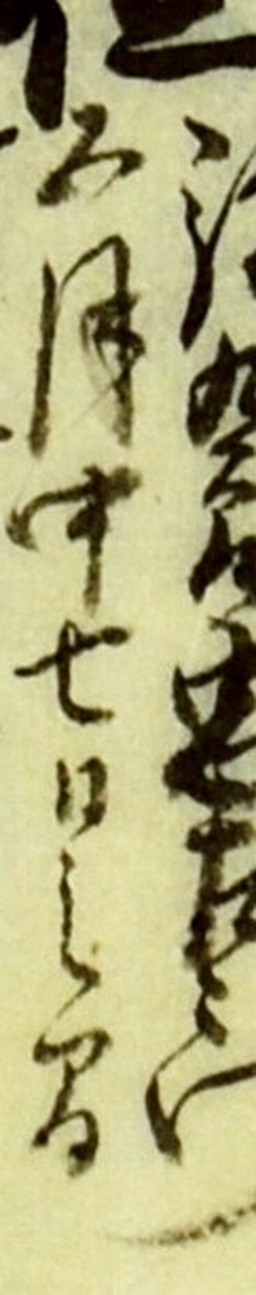五月中七日之間
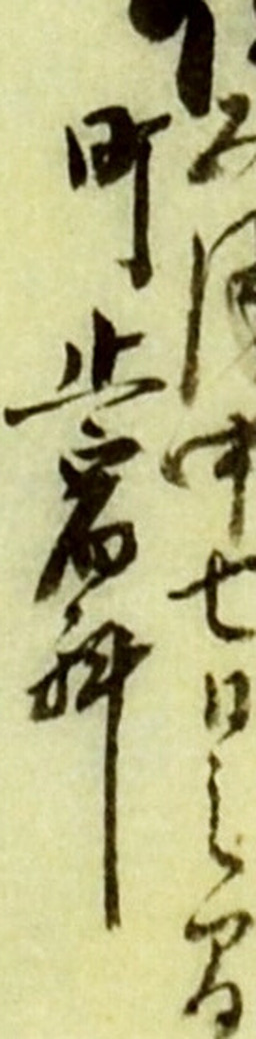町止宿料
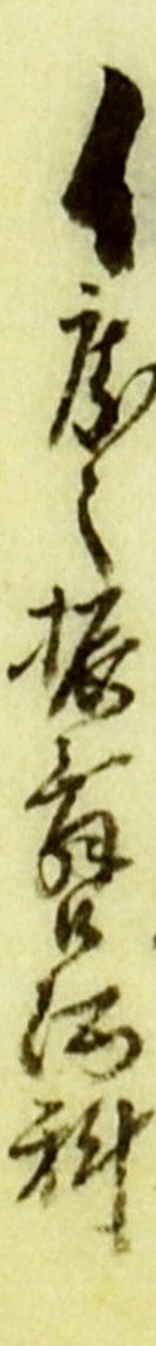度々振舞候酒代
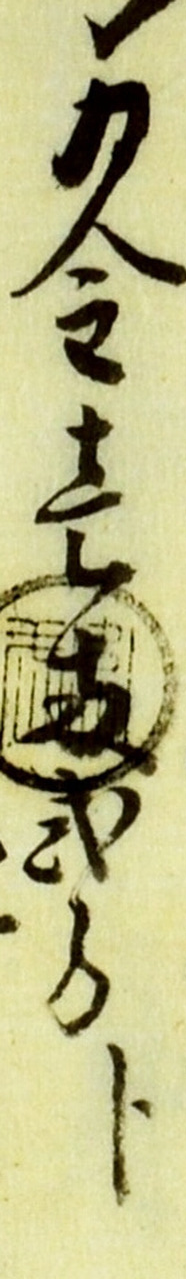為金壱両弐分ト
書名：覚
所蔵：伊那市立高遠町図書館・合同会社AMANE
